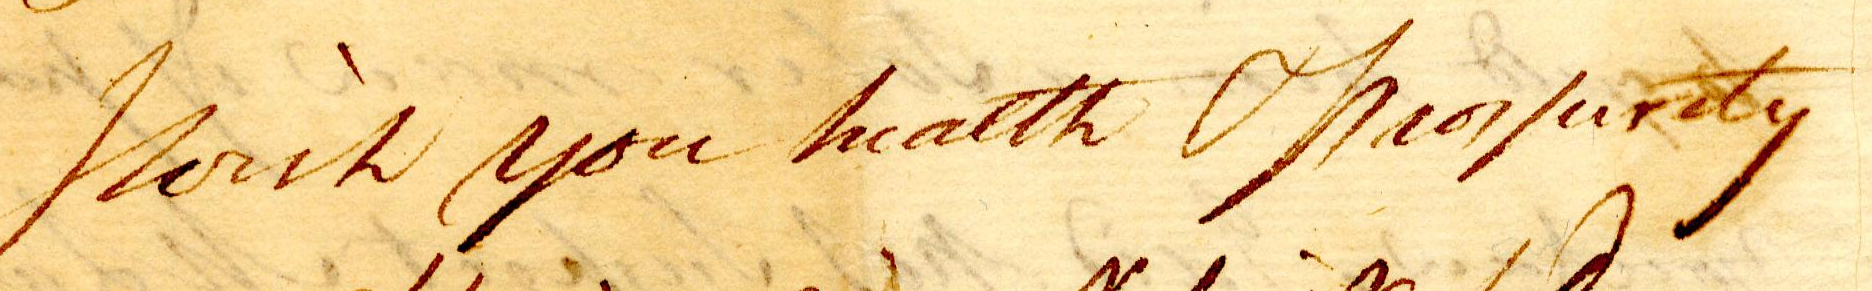I wish you health & opportunity
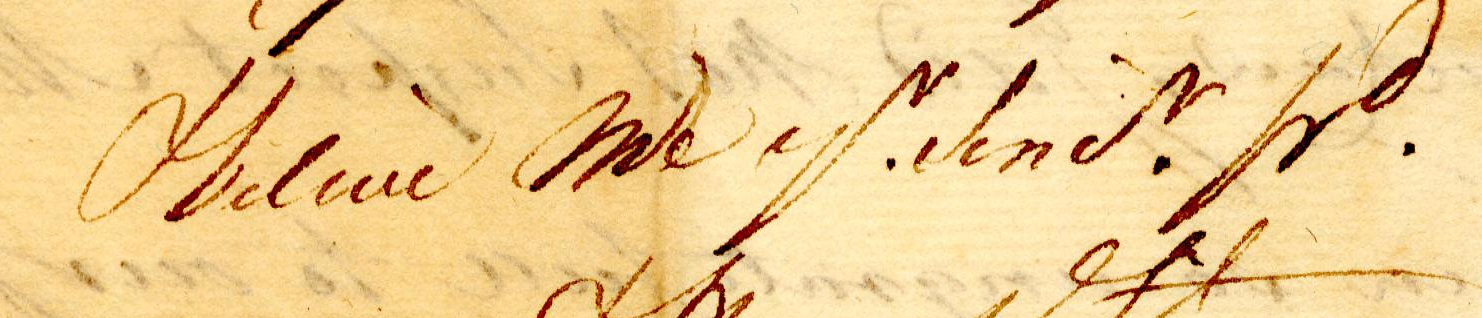& belive Me y^r. Sinc^r. fr^d.
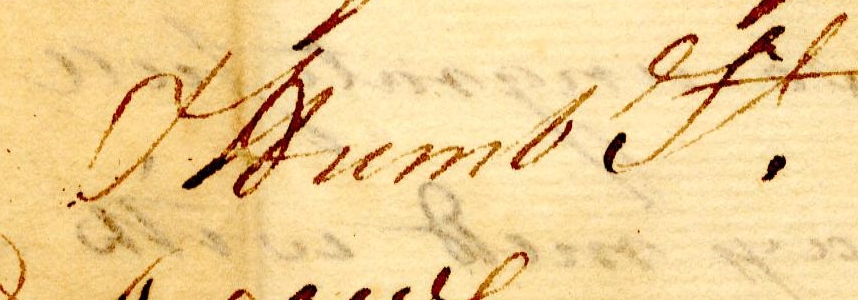& Humb^l S^t.
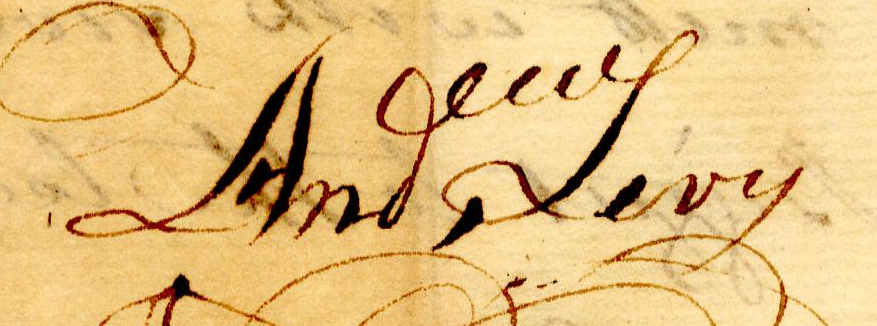And^rew Levy
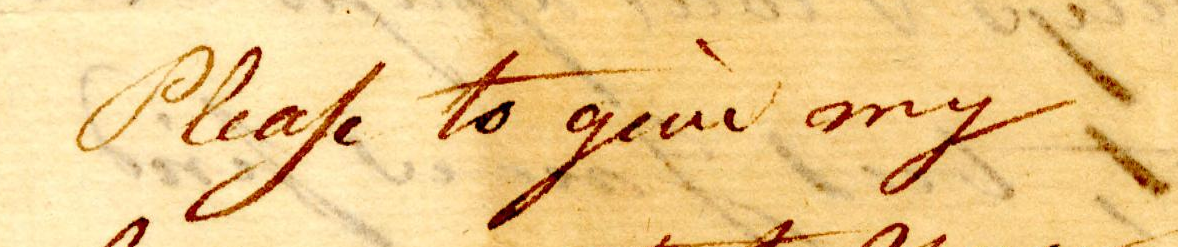Please give my
